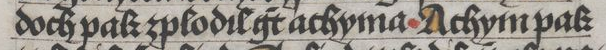doch pak zplodil ḡt Achyma.Achym pak¬
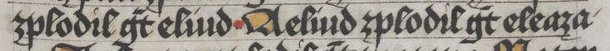zplodil ḡt elíud.A elíud zplodil ḡt eleaza¬
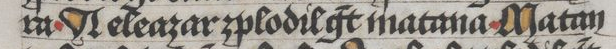ra.A eleazar zplodil ḡt matana.Matan
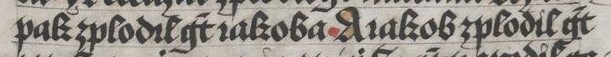pak zplodil ḡt iakoba.A iakob zplodil ḡt
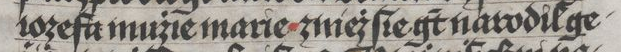iozefa mużie marie.zníeż ſie ḡt narodil ge¬
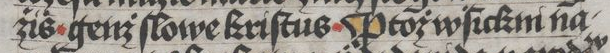żíṡ.genż ſlowe kriſtus.ꝓtož wẛickni na¬
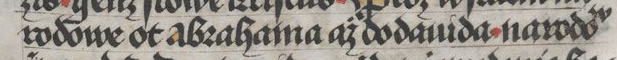rodowe ot abrahama aż do dauida.narodow
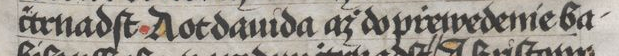čtrnadſt.A ot dauida aż do pṙewedeníe ba¬
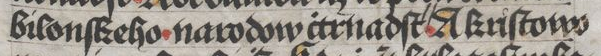bílonſkeho.narodow ċtrnadſt.A kriſtowo
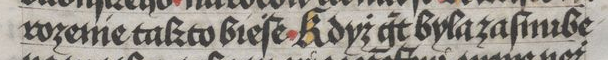rozeníe takto bieẛe.Kdyż ḡt byla zaſnube¬
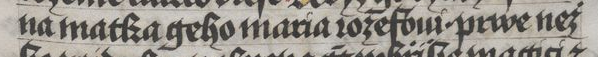na matka geho maria iozefoui prwe neż
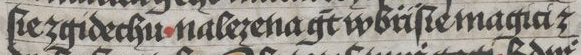ſie zgidechu.nalezena ḡt wbṙíẛíe magici z
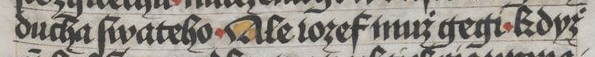ducha ſwateho.Ale iozef muż gegi.kdyż
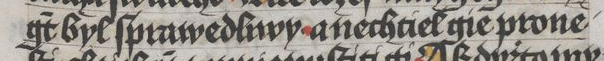ḡt byl ſprawedliwy a nechtiel gíe prone¬
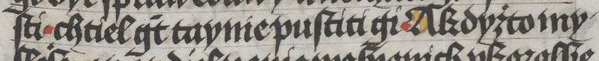ſti.chtiel ḡt taynie puſtiti gi.Akdyżto my¬
